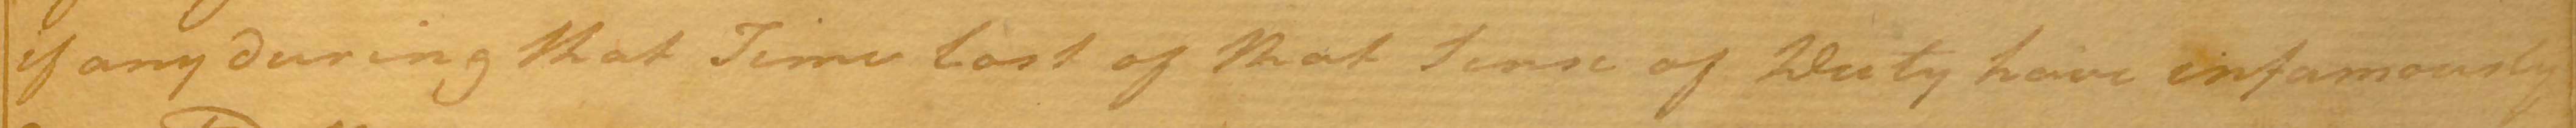if any during that Time last of that Duty have infamously
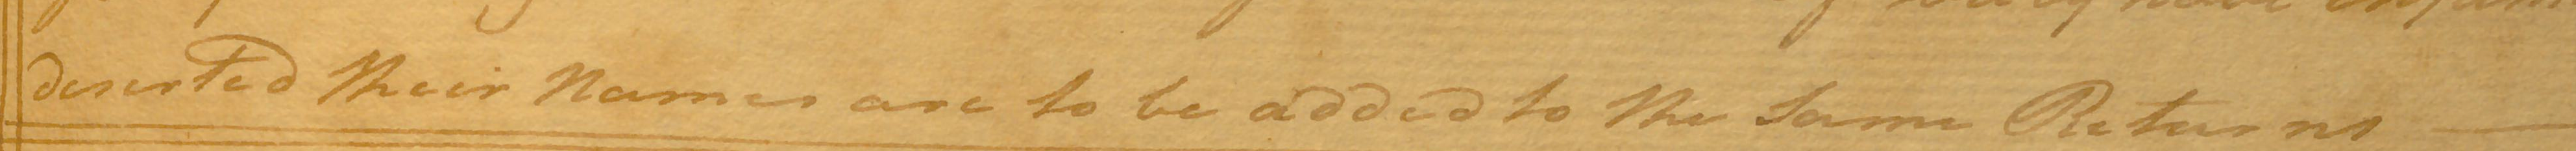deserted their Names are to be added to the same Returns-
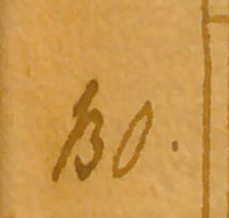BO.
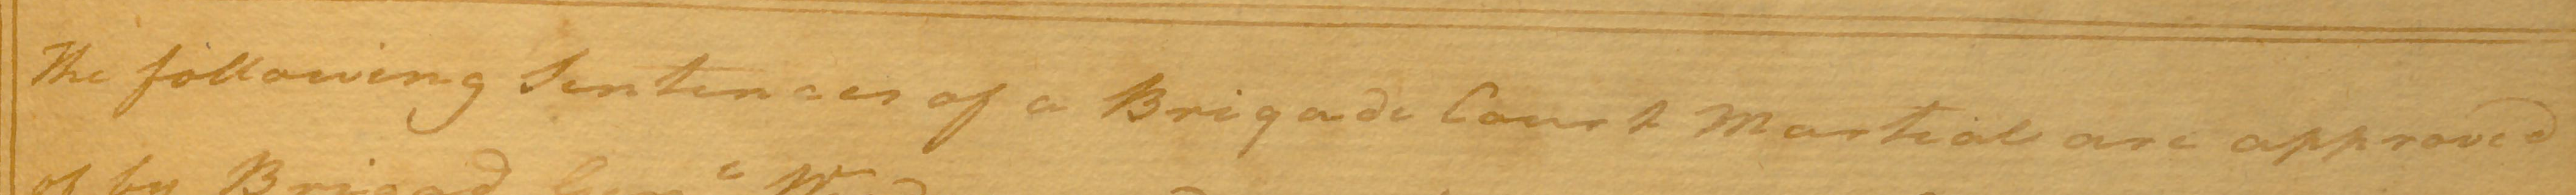The Following Sentences of a Brigade Court Martial are approved
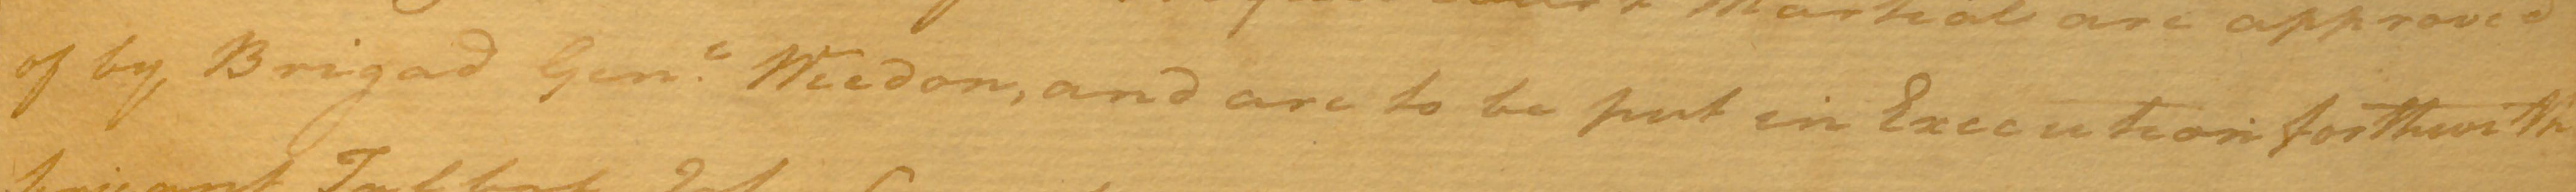of by Brigad Gen^l. Weedon, and are to be put in Execution forthwith
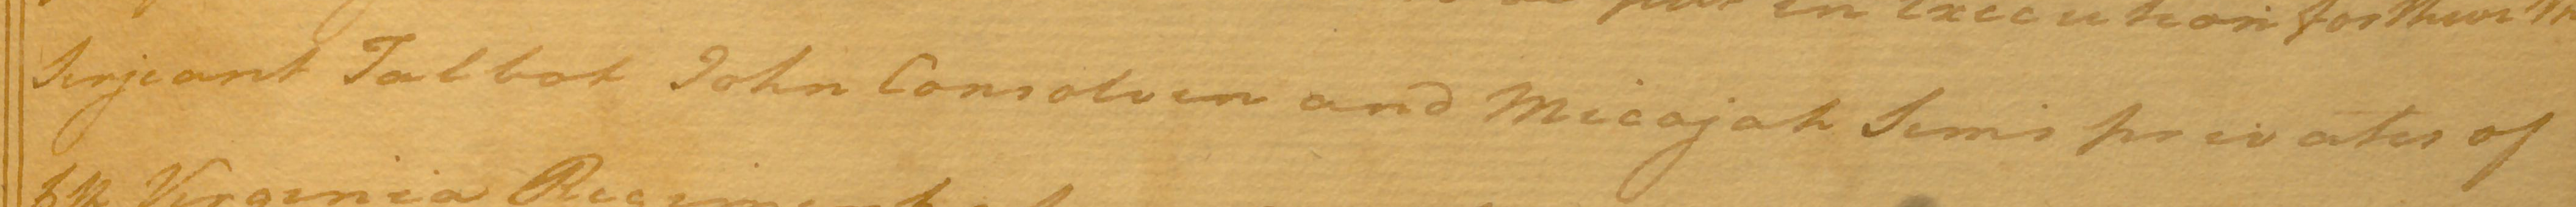Serjeant Talbot John Consolven and Micajah Sims privates of
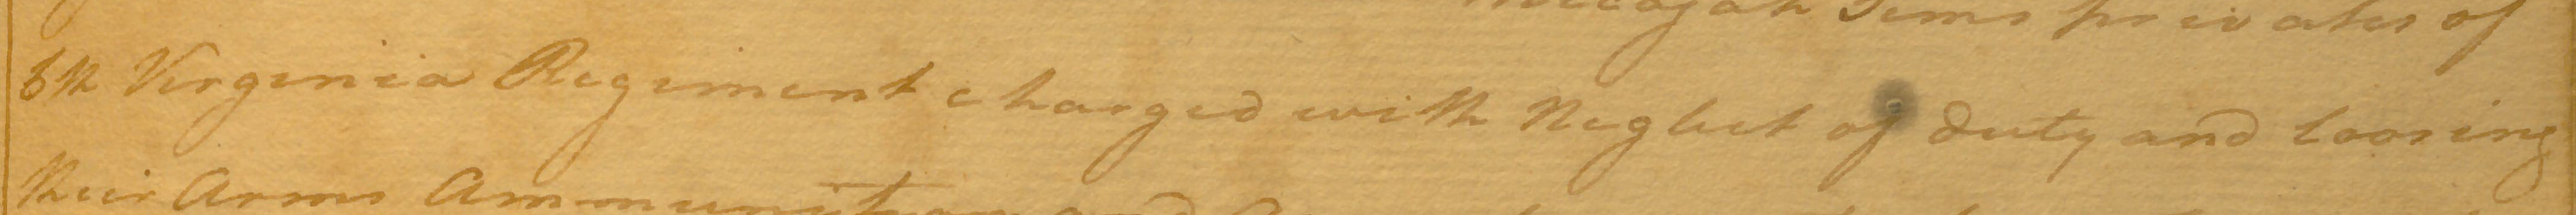6th Virginia Regiment charged with Neglect of duty and loosing
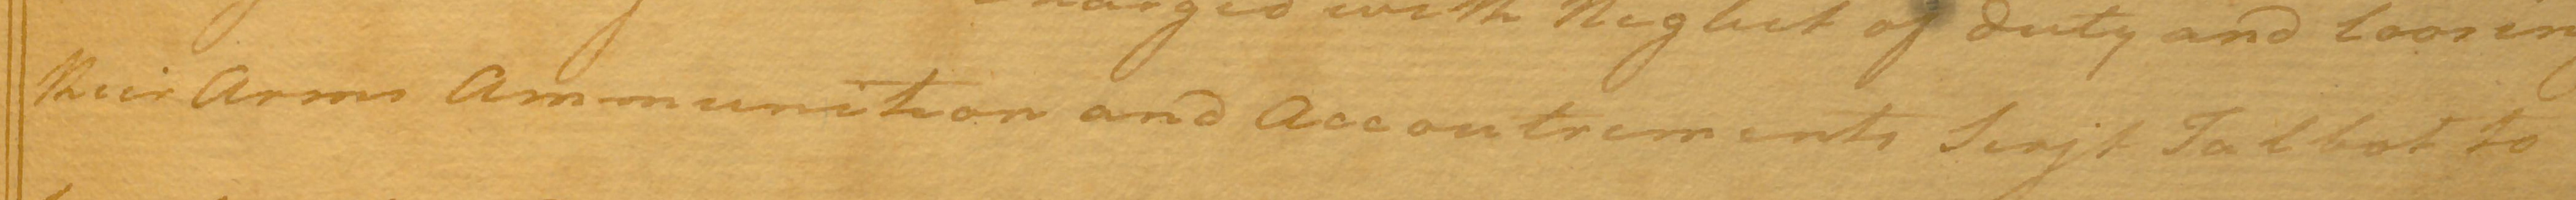their Arms Ammunition and Accoutrements Serjt Talbot to
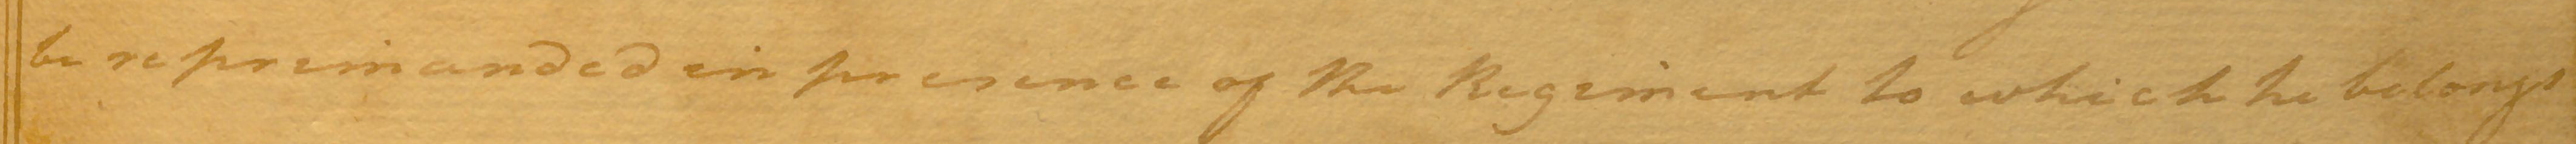be reprimanded in presence of the Regiment to which he belongs
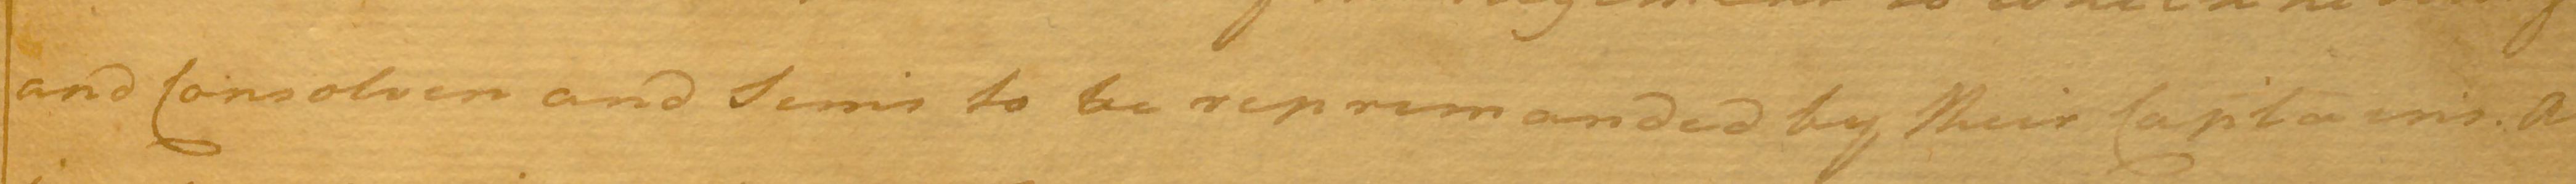and Consolven and Sims to be reprimanded by their Captains. A
